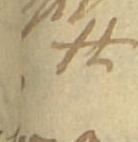-^th
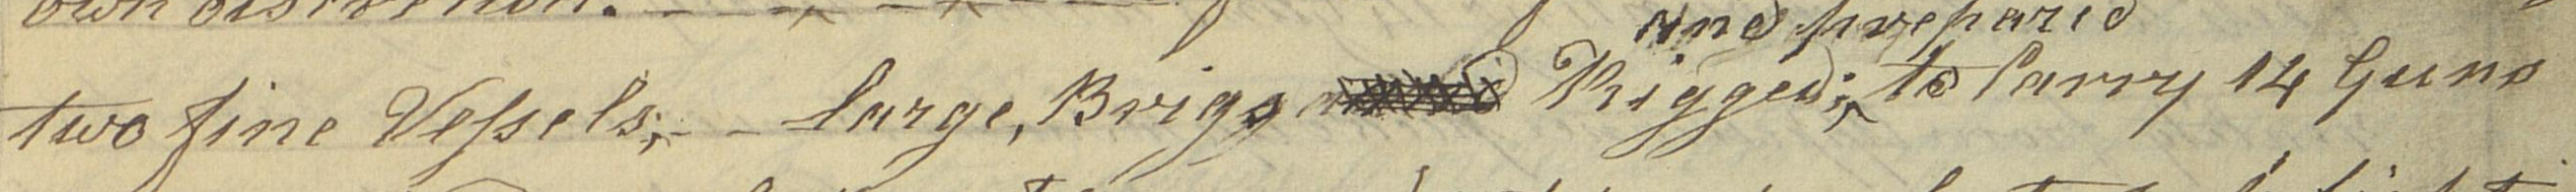two fine Vessels; large Brigs and Rigged; ^ to Carry 14 Guns
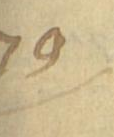-779
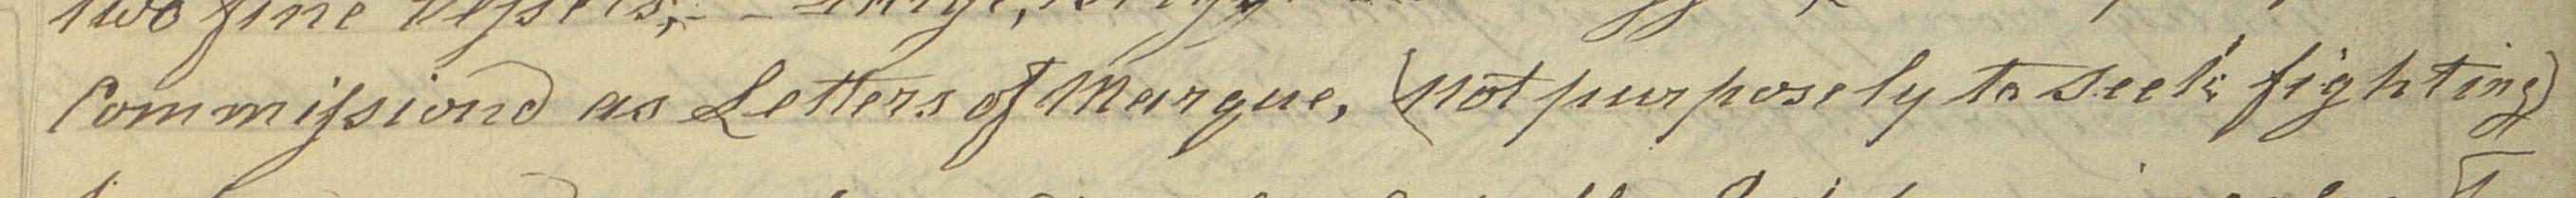commissioned as Letters of Marque (not purposely to seek fighting)
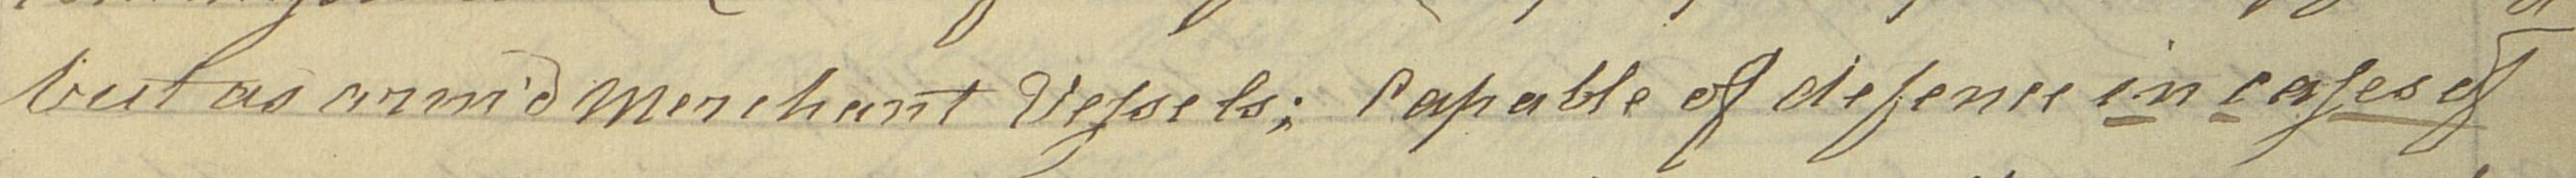but as arm'd merchant Vessels; Capable of defence in cases of
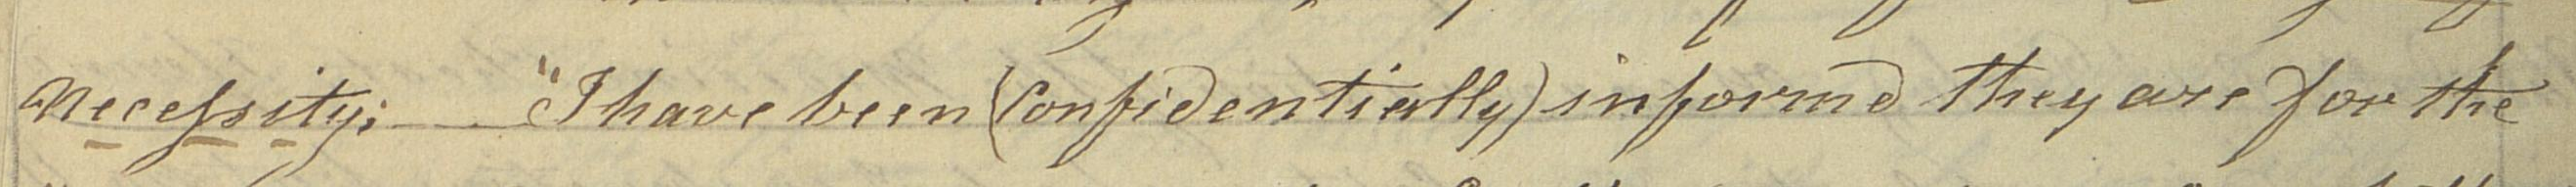necessity; "I have been (Confidentially informd they are for the
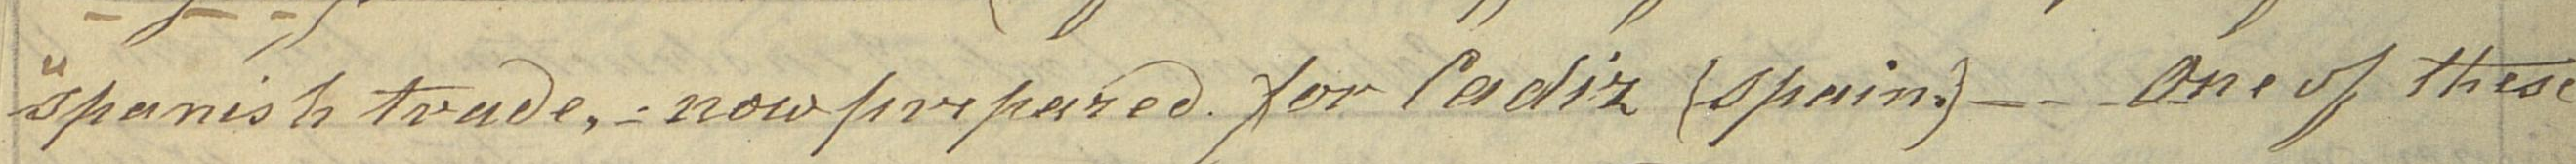spanish trade, now prepared for Cadiz (Spain.) One of these
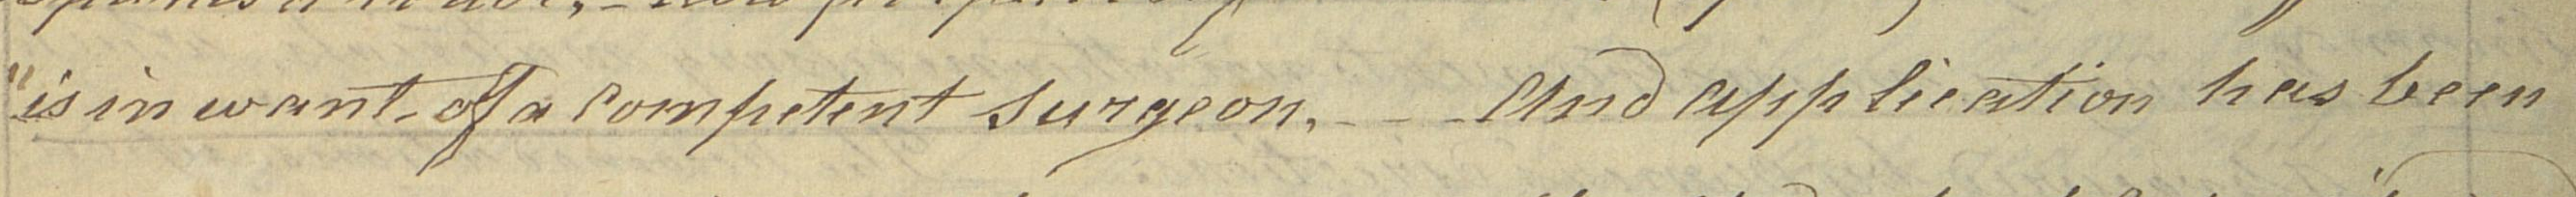"is in want of a Competent surgeon. And application has been
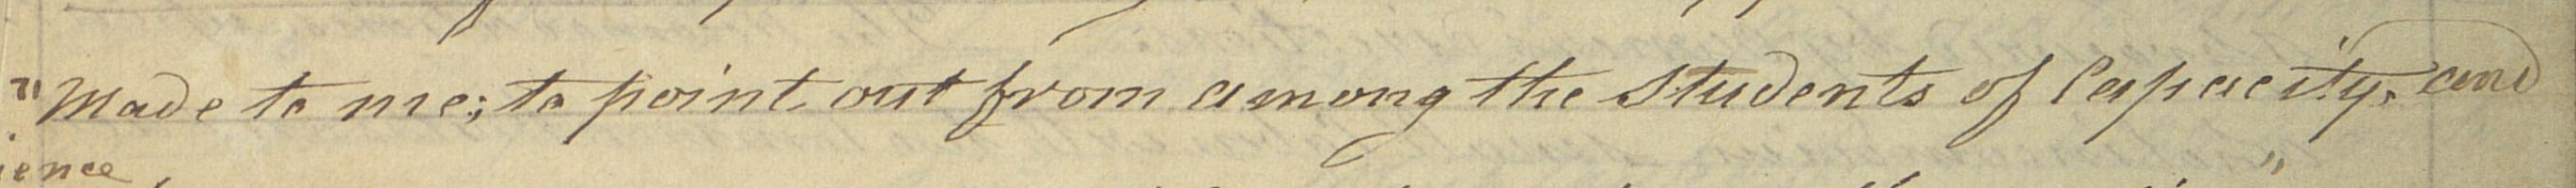"made to me; to point out from among the students of Capacity, and
